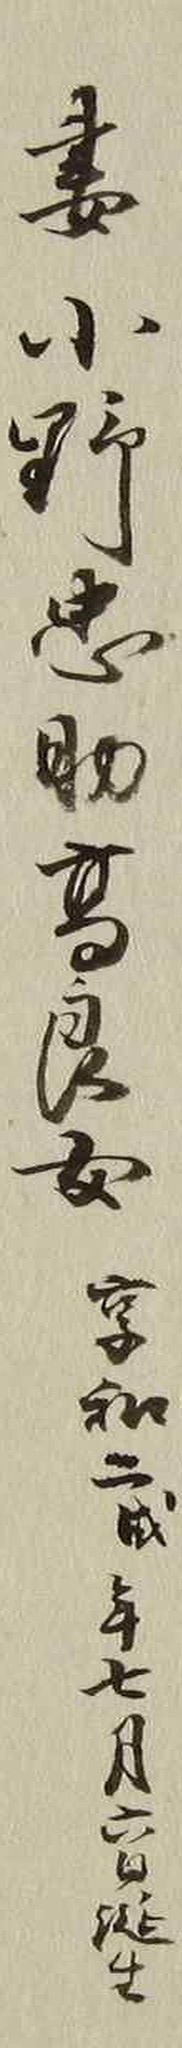妻小野忠助高良女享和二戌年七月六日誕生
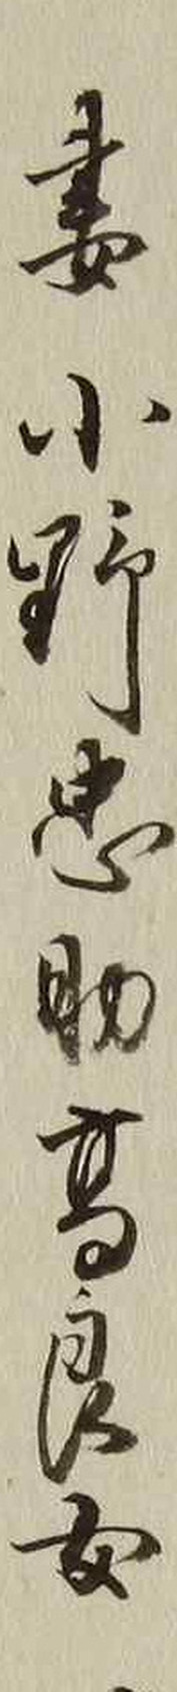小野忠助高良妻
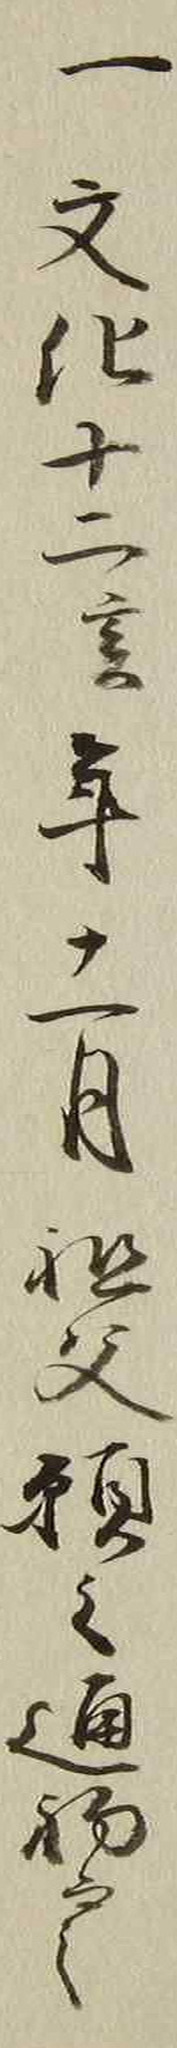一文化十二亥年十一月祖父願之通初而之
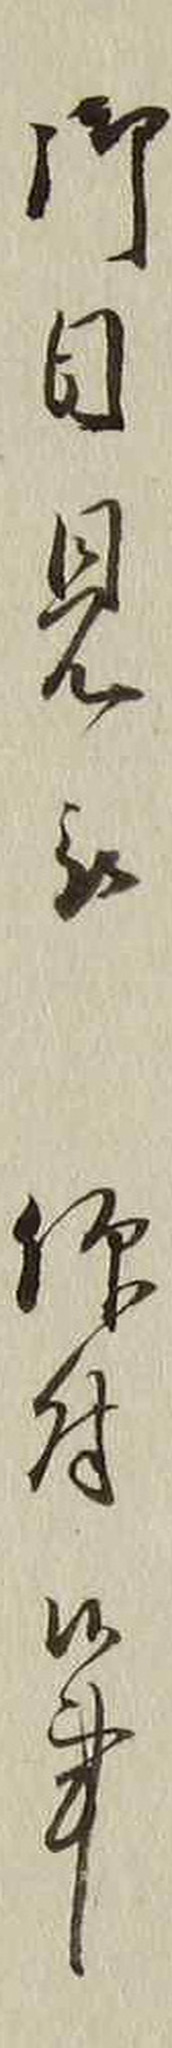御目見被仰付候事
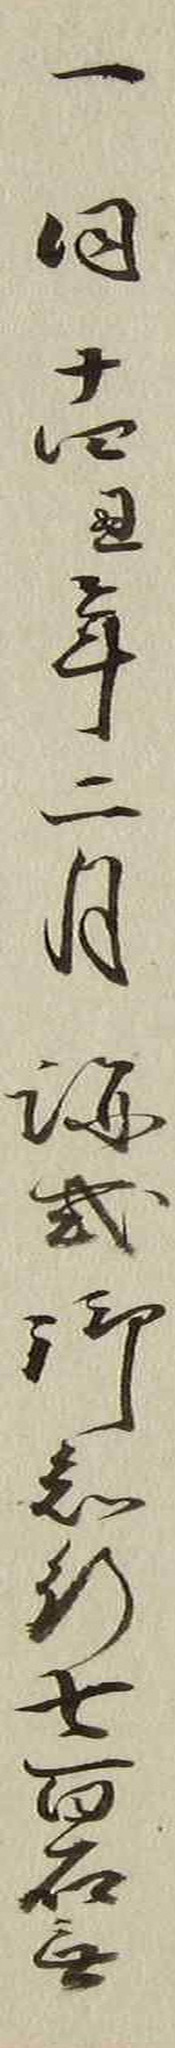一同十四丑年二月跡式御知行七百石無
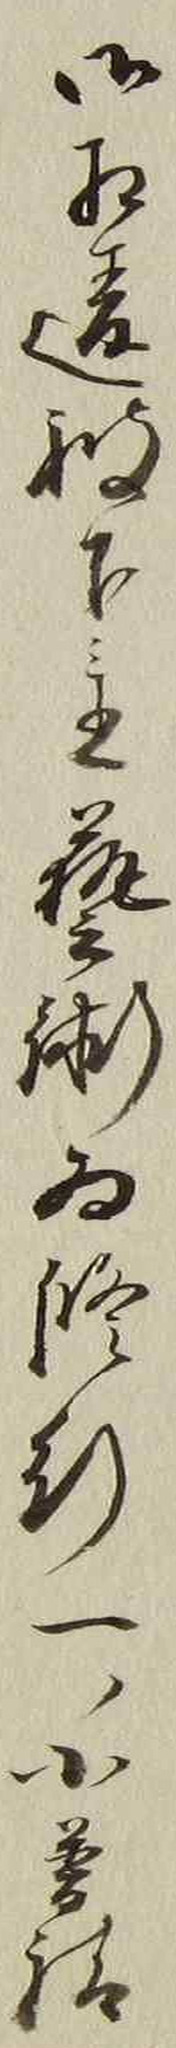御相違被下置芸術為修行一ノ小普請
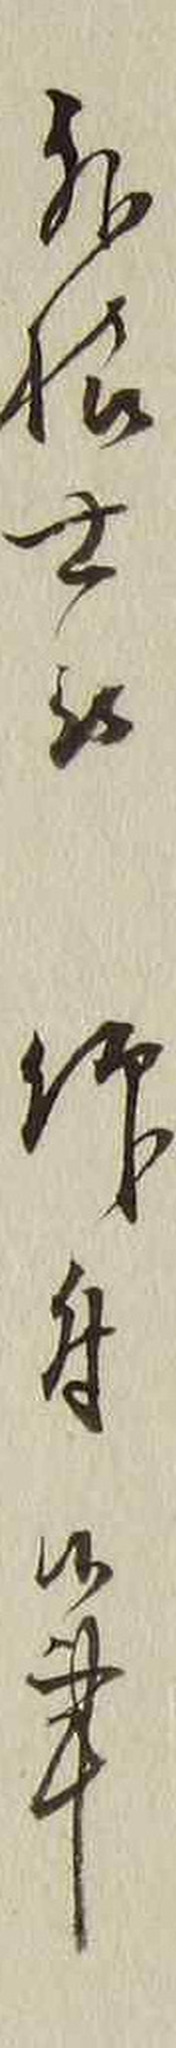外様士被仰付候事
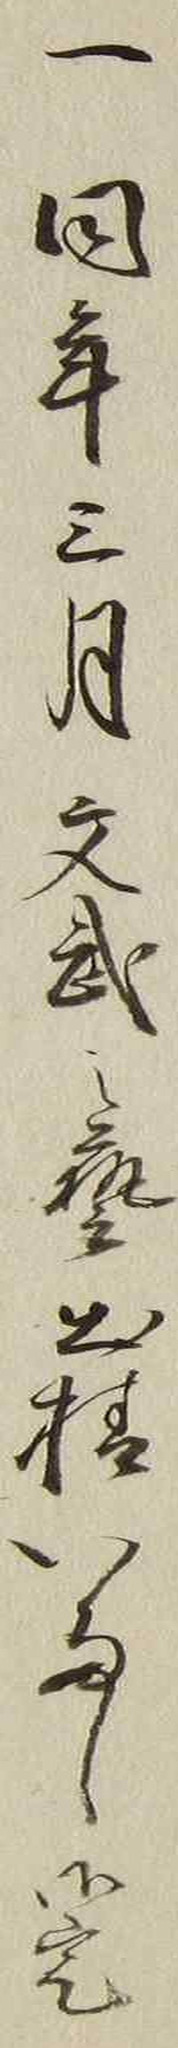一同年三月文武之芸出精いたし御定
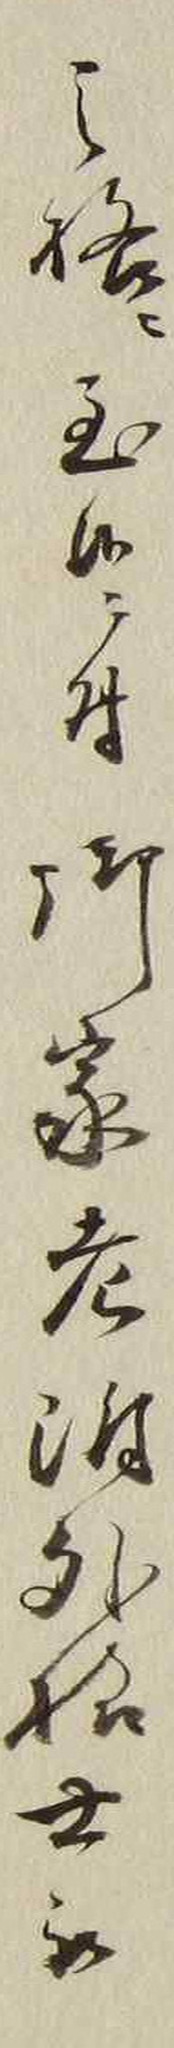之格ニ至候ニ付御家老附外様士被
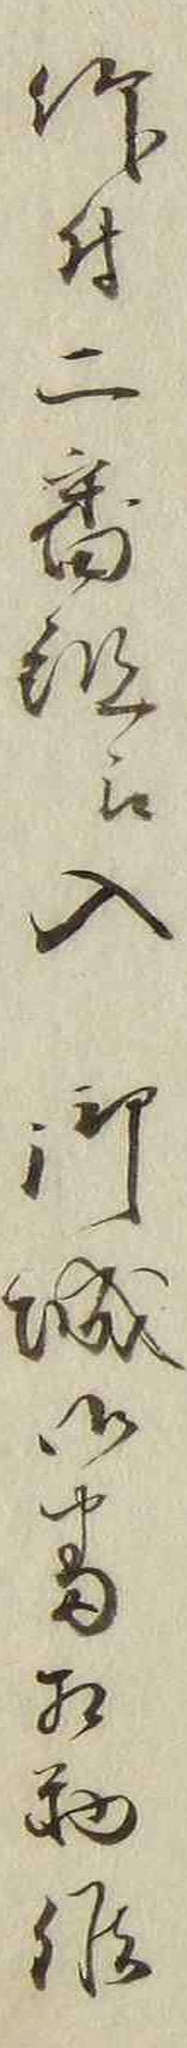仰付二番組江入御城御番相勤候

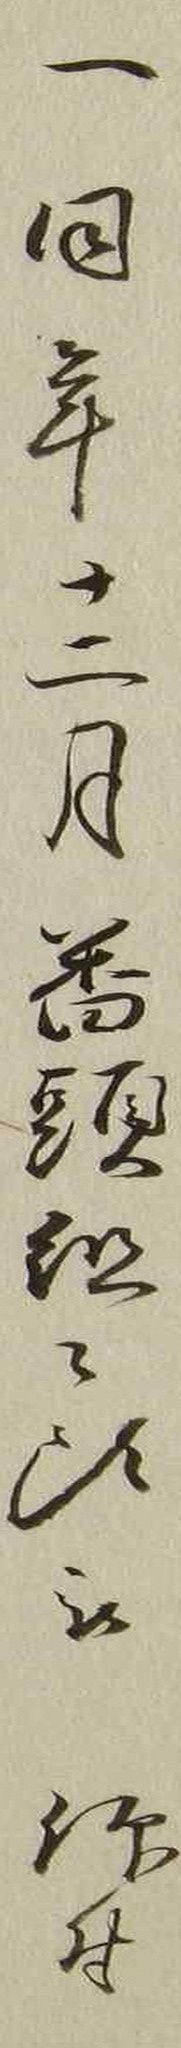一同年十二月番頭組々頭被仰付
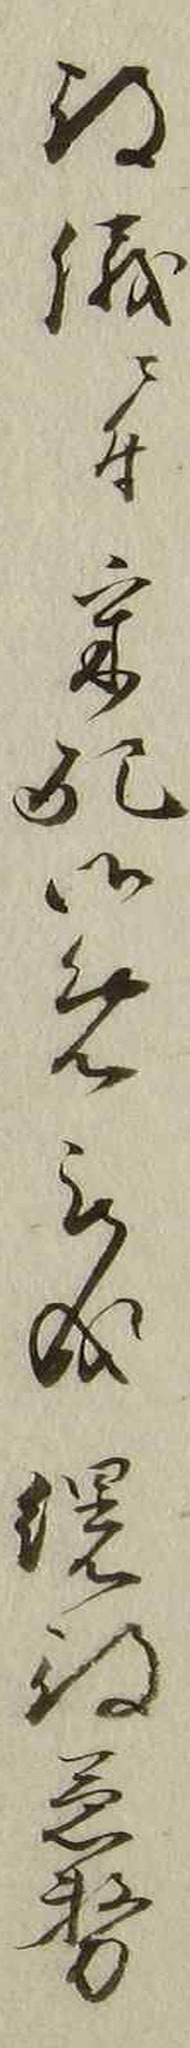役儀ニ付采配御免被成縨役兼務
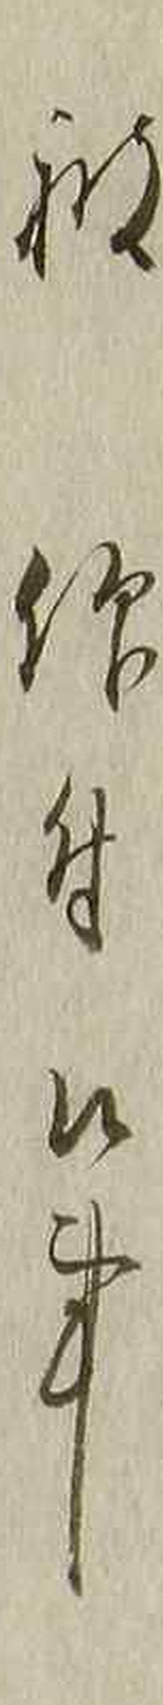被仰付候事
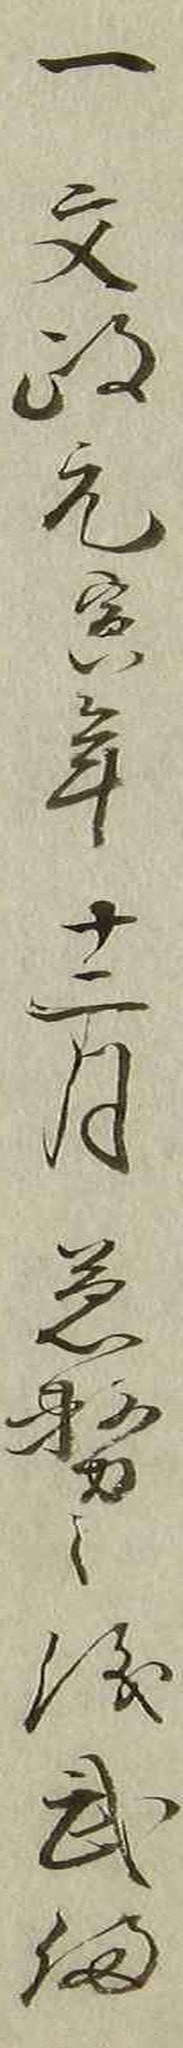一文政元寅年十二月兼務之儀武備
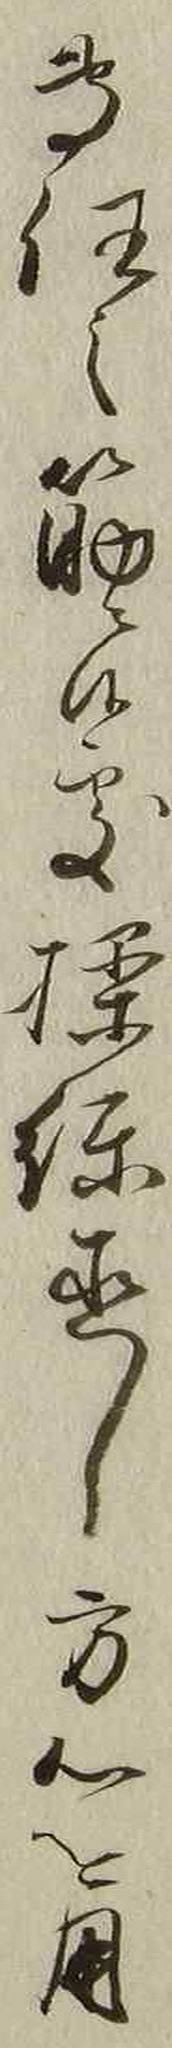専任之筋ニ候処操練直し方心を用
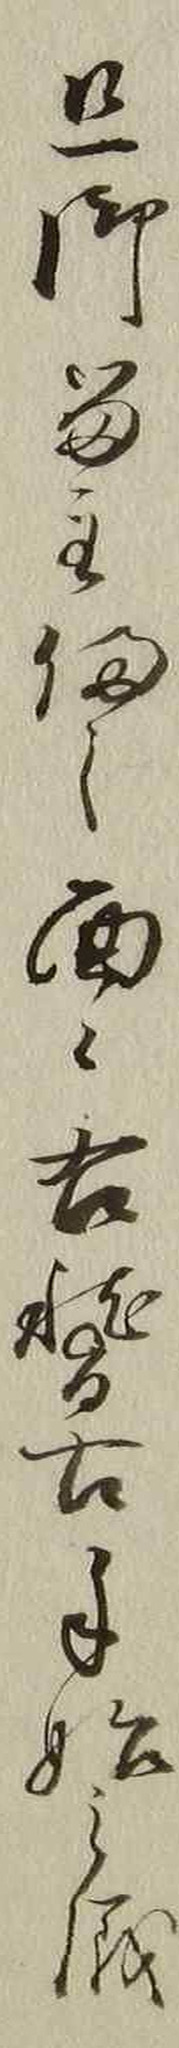且御留守備之面々右稽古手始之儀
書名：諸士系譜　巻之122　よ之部5
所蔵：会津若松市立会津図書館
